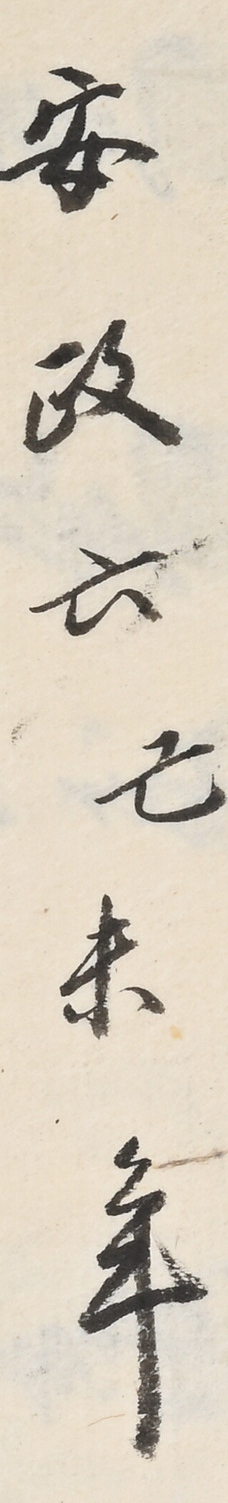㊞安政六己未年
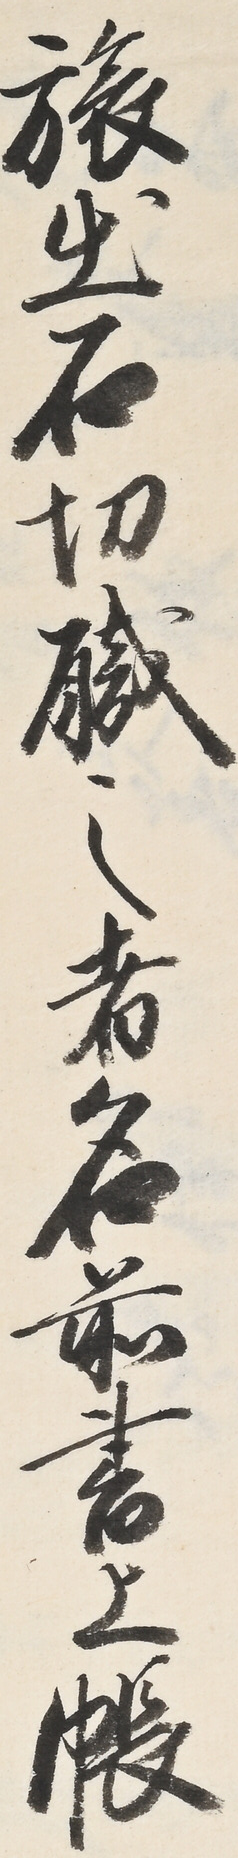旅出石切職之者名前書上帳
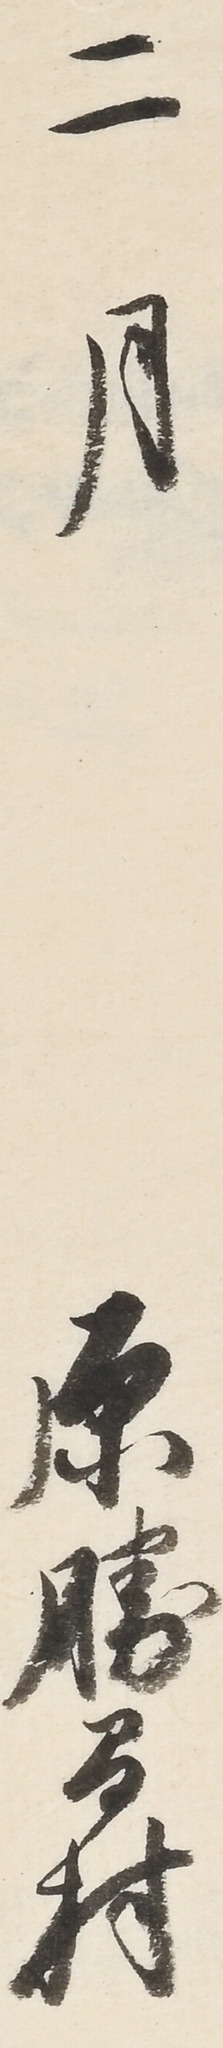㊞二月原勝間村

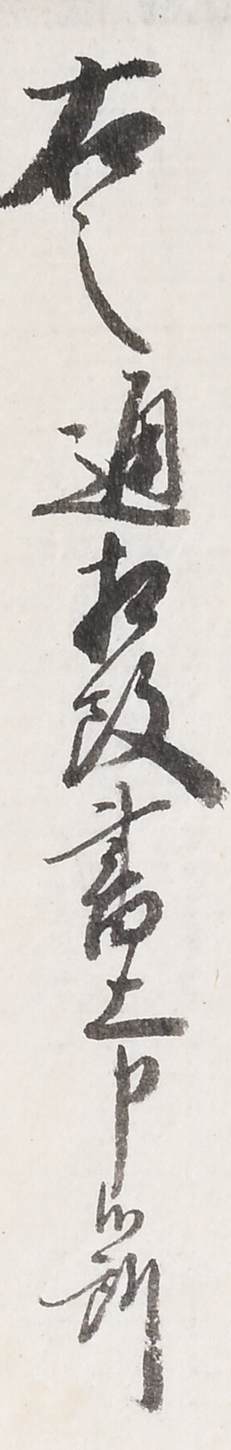右之通相改書上申候所
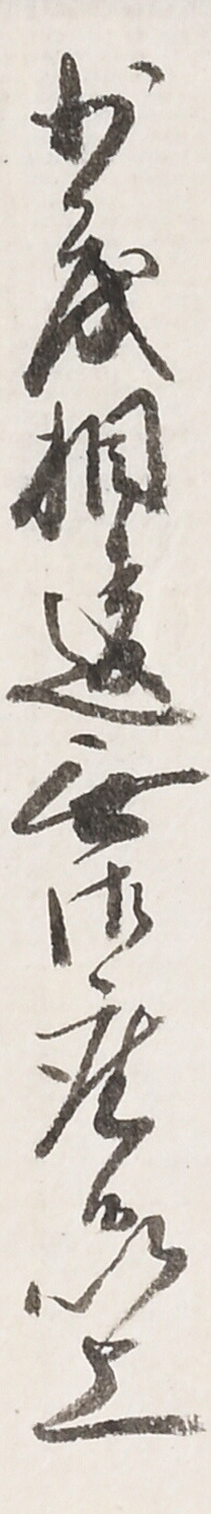少も相違無御座候以上
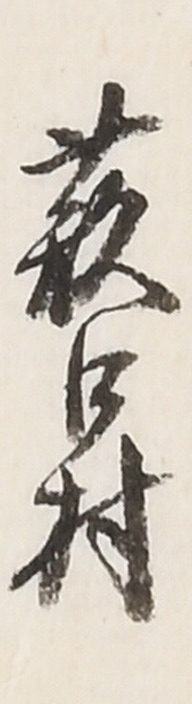荊口村
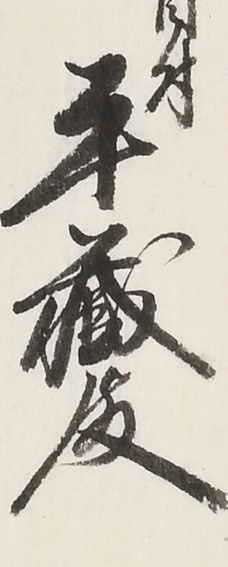平蔵殿
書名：安政六己未年二月旅出石切職之者名前書上帳
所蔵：伊那市立高遠町図書館・合同会社AMANE
